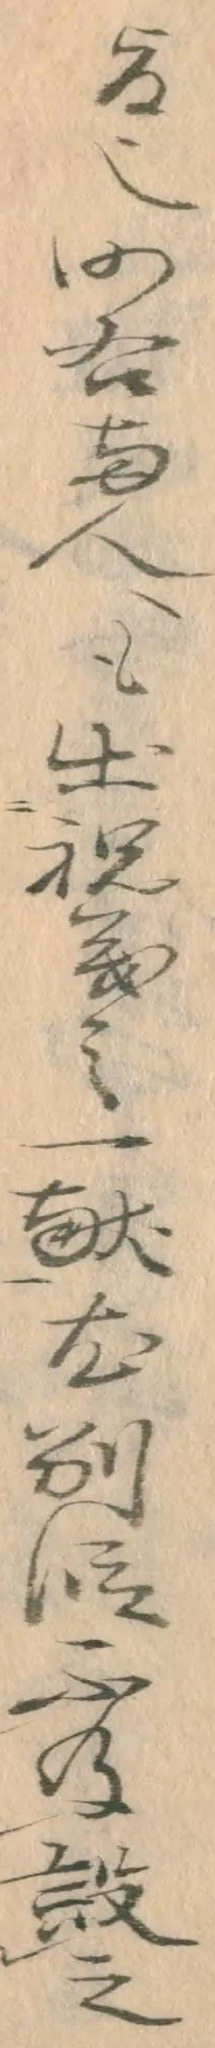旨也仍右両人へも出祝義之一献尤別段不及設之
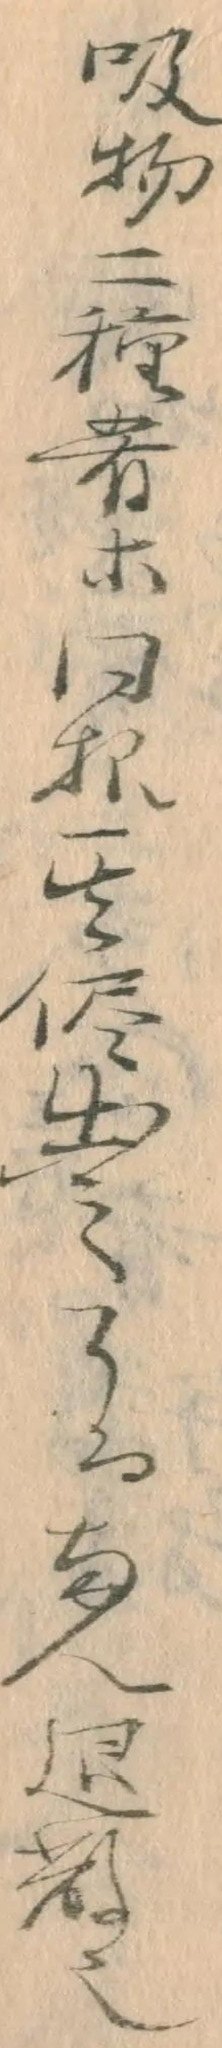吸物二種肴等同様其侭出之了而両人退散之
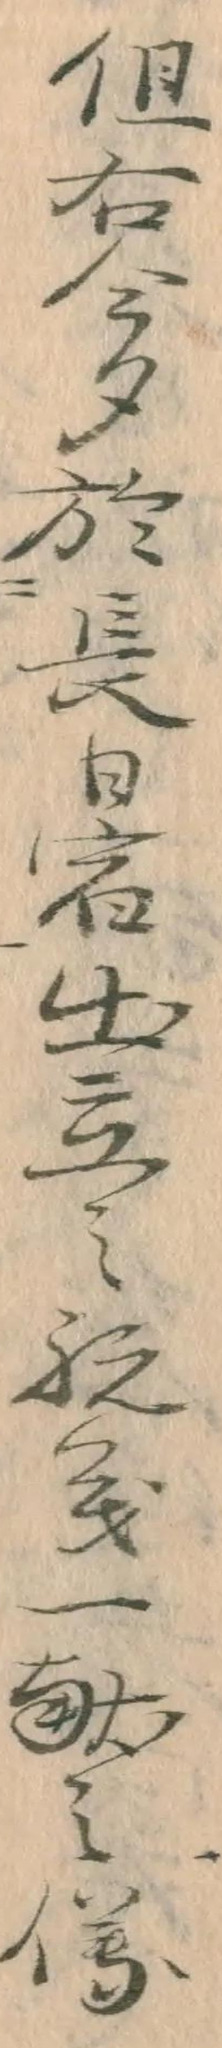但右今夕於長日宿出立之祝義一献之儀
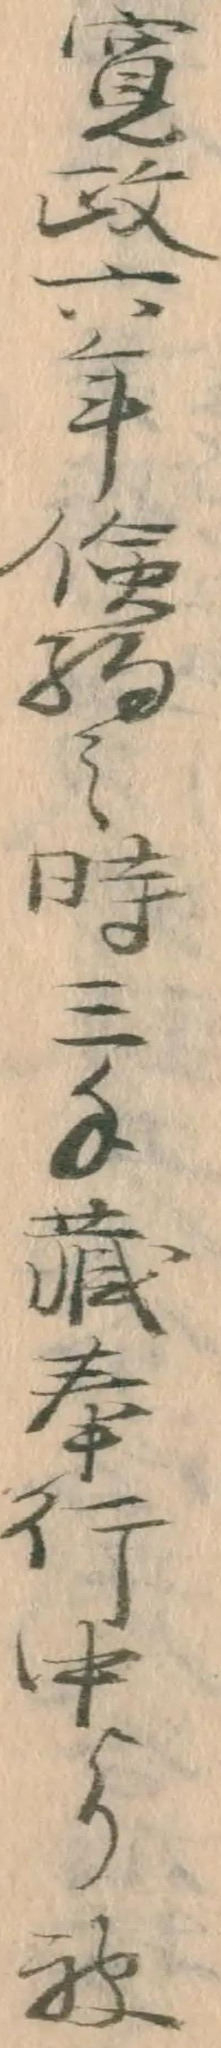寛政六年倹約之時三手蔵奉行中より被
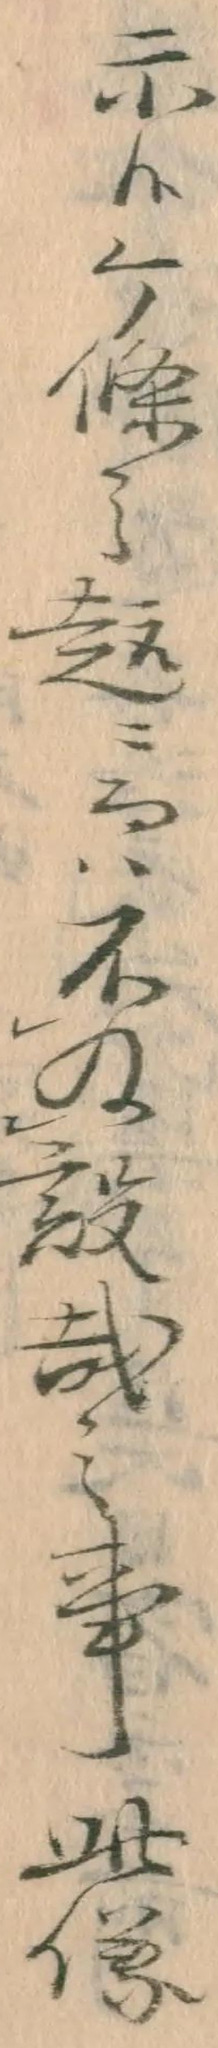示候ケ條之趣ニ而ハ不及設哉之事此儀
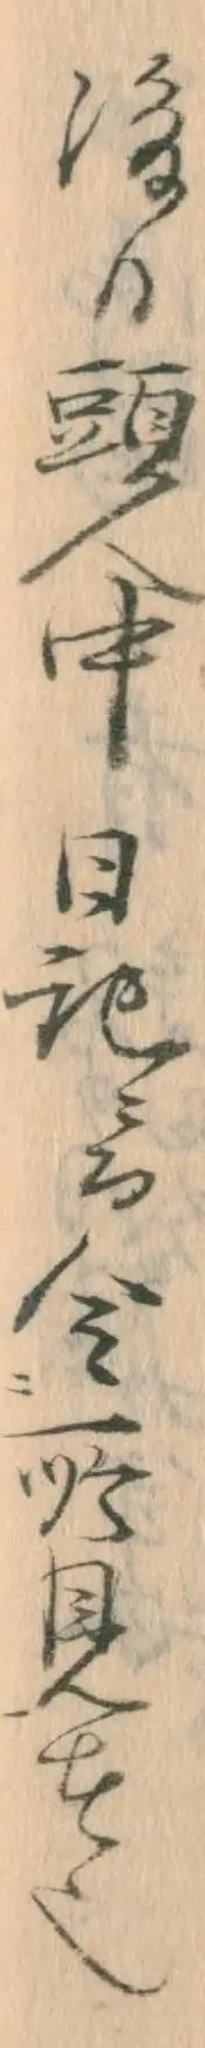後日頭人中日記ニ而令所在也
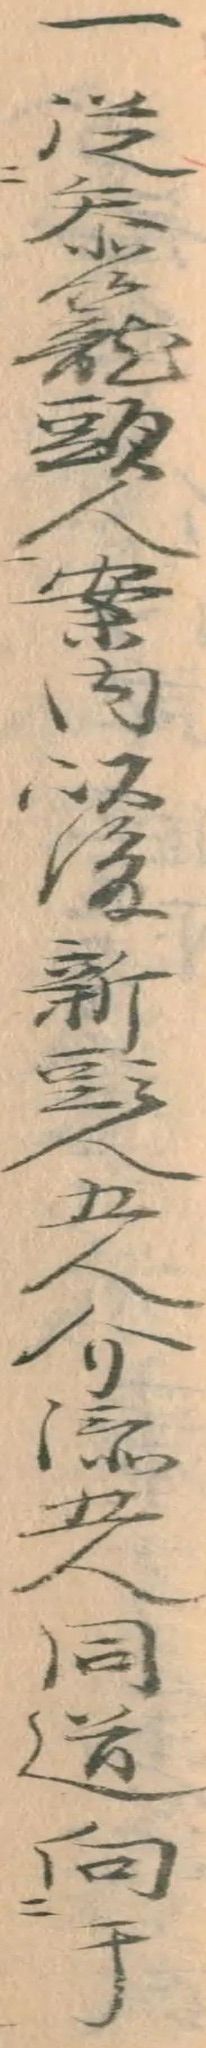一従参籠頭人案内以後新頭人五人介添五人同道向于
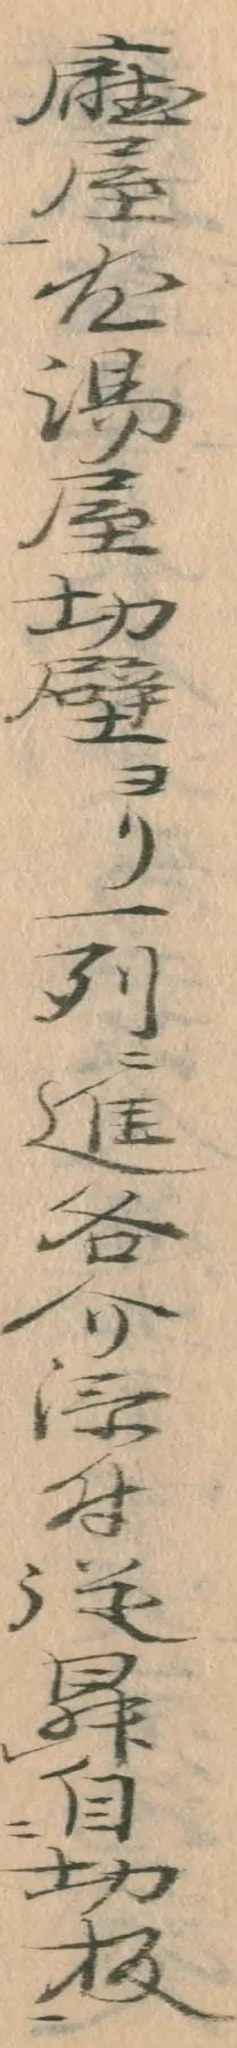廰屋尤湯屋切壁ヨリ一列ニ進各介添付従昇自切板
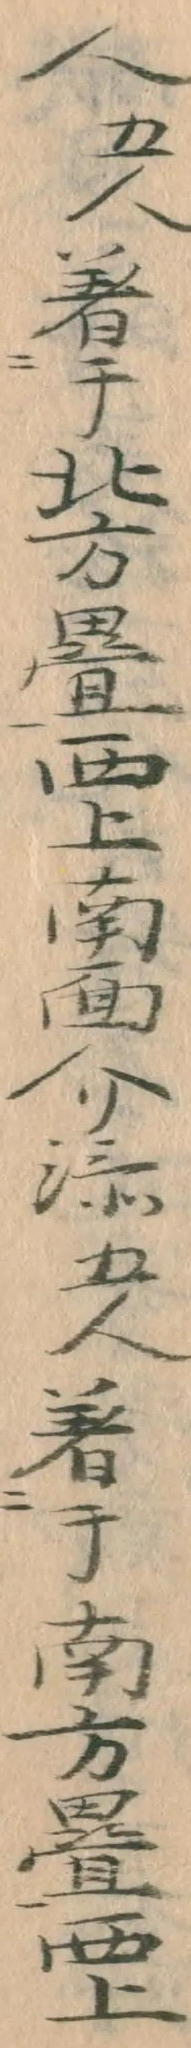人五人着于北方畳西上南面介添五人着于南方畳西上
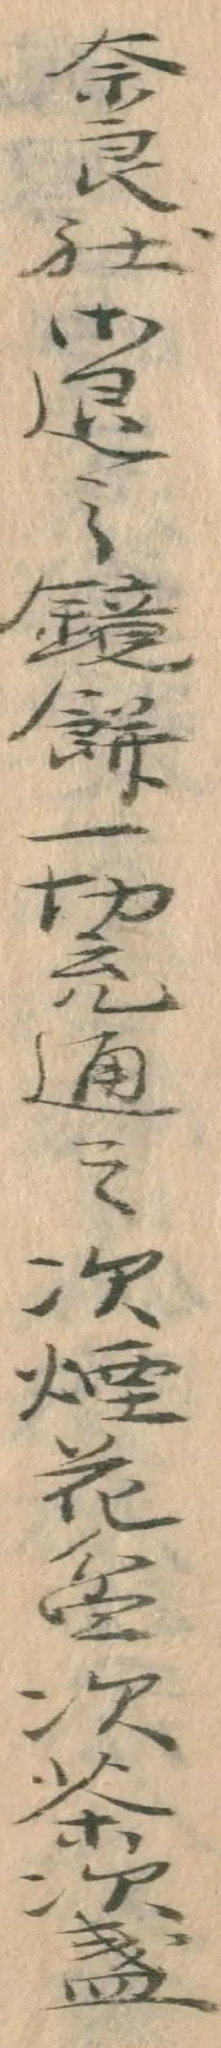奈良社御退之鏡餅一切充通之次煙花盆次茶次盞
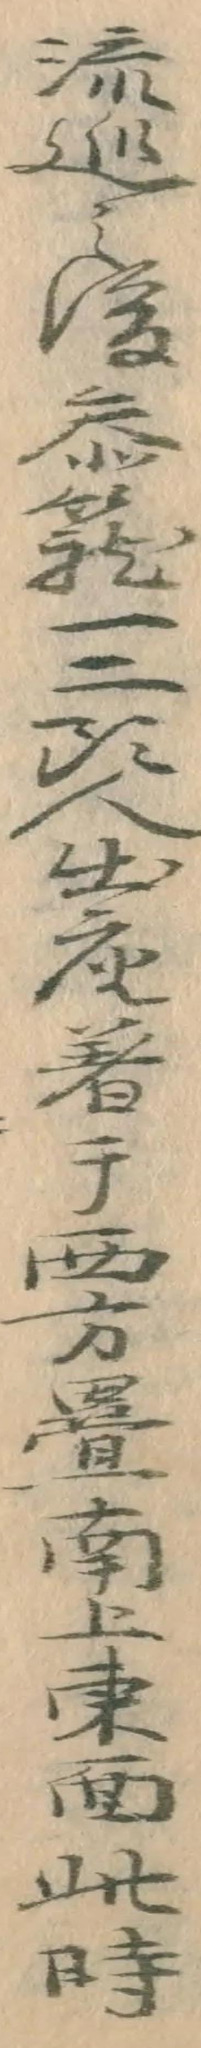流巡之後参籠一二頭人出座着于西方畳南上東面此時

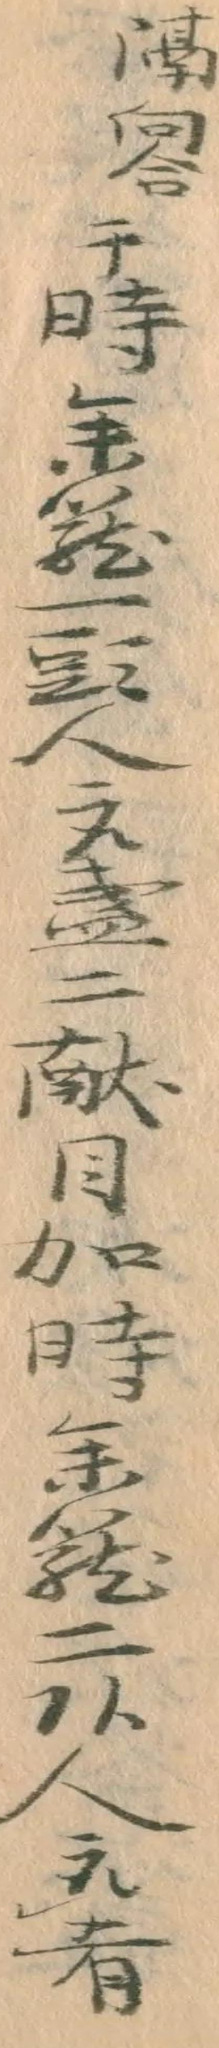隔向合于時参籠一頭人取盞二献目加時参籠二頭人取肴
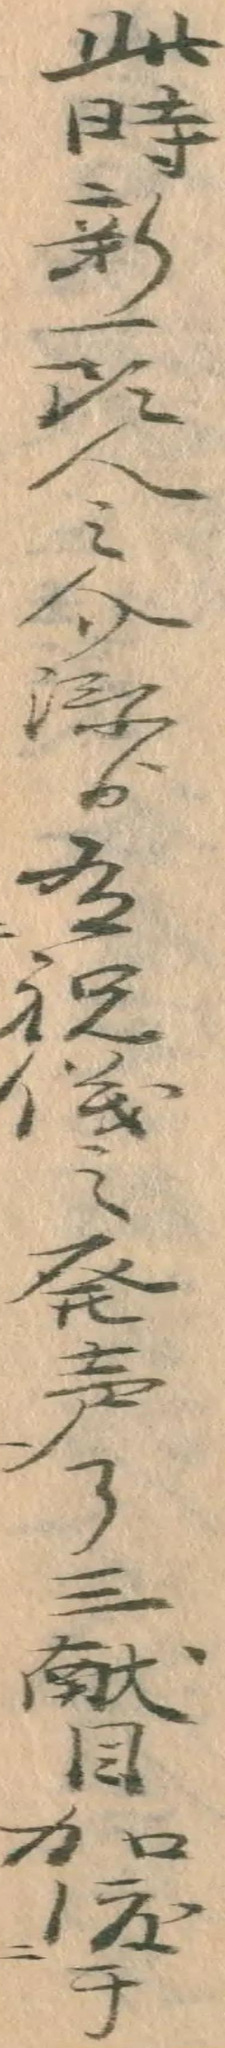此時新一頭人之介添ゟ有祝儀之発声了三献目加渡于
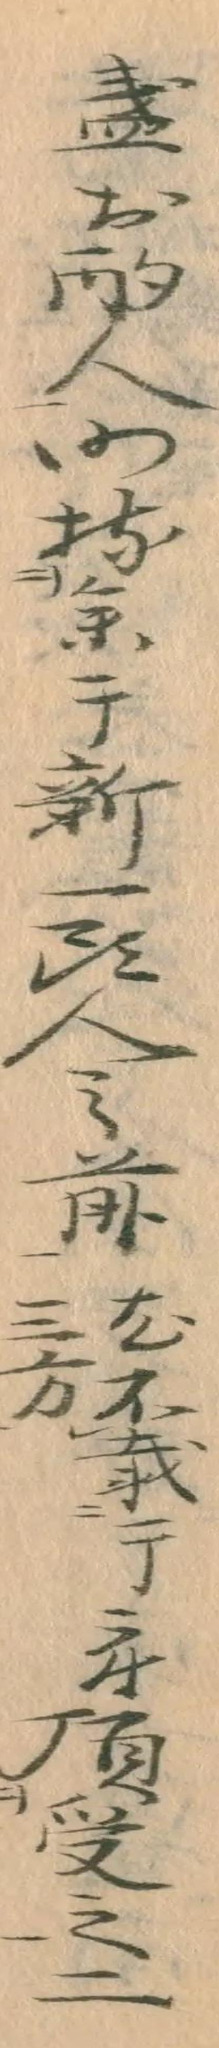盞於酌人仍持参于新一頭人之前尤不載于三方ニ付頂受之二
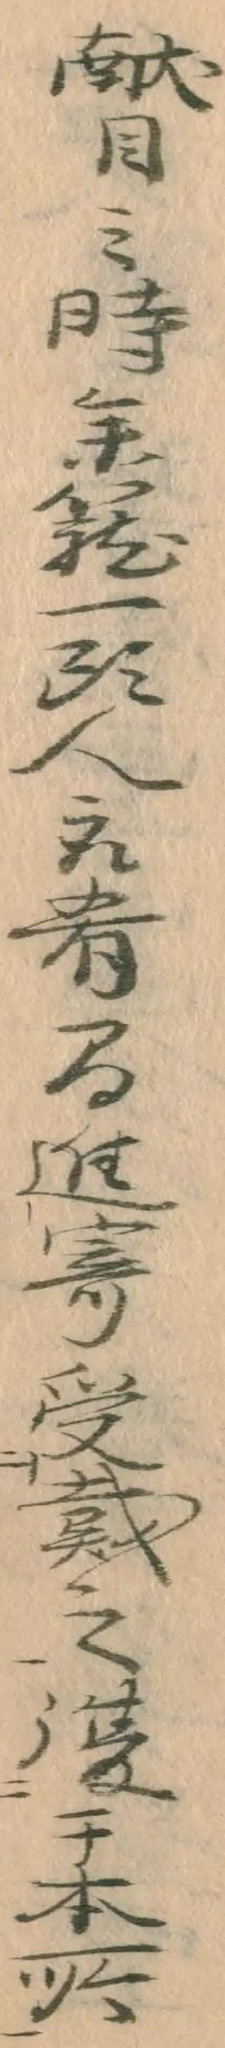献目之時参籠一頭人取肴間進寄受レ載之復于本所
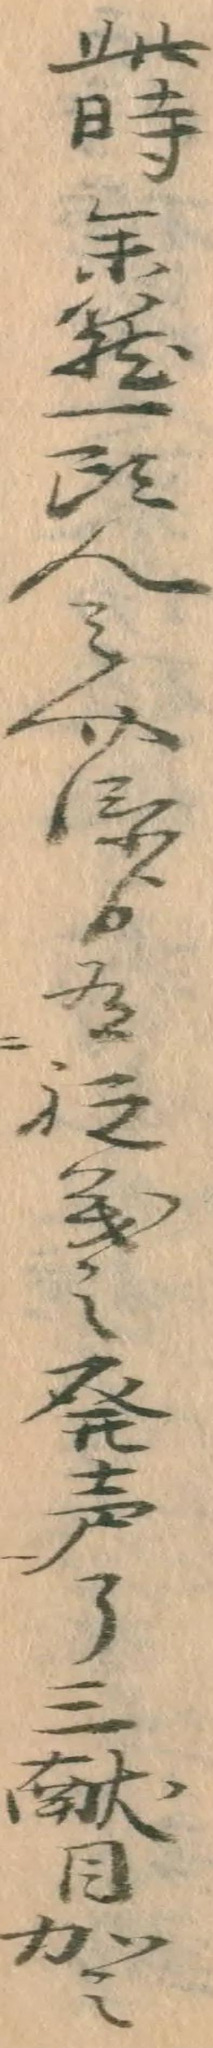此時参籠一頭人之介添ゟ有祝義之発声了三献目加之
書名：賀茂社記録. 第72冊
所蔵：国立国会図書館 National Diet Library, JAPAN
